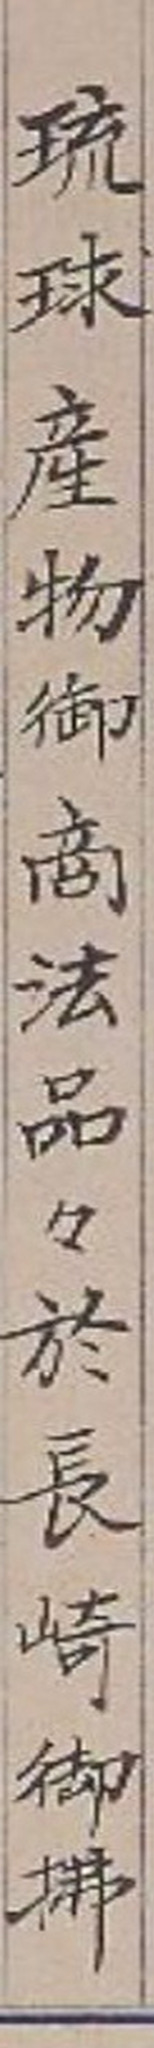琉球産物御商法品々於長崎御拂
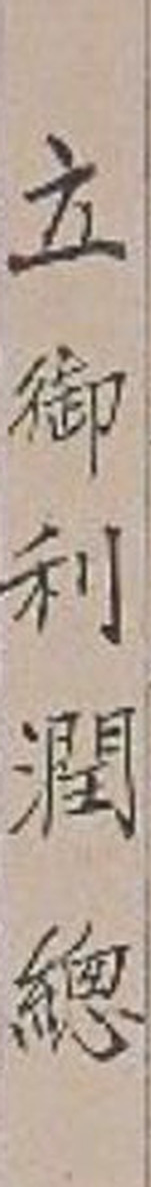立御利潤總
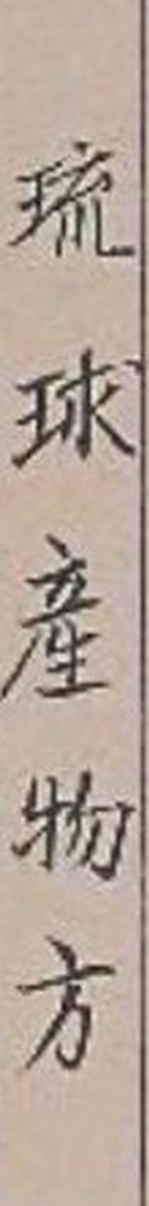琉球産物方

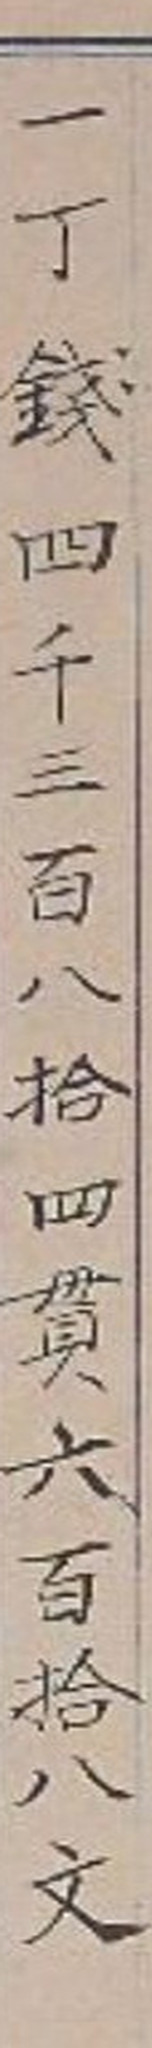一丁銭四千三百八拾四貫六百拾八文
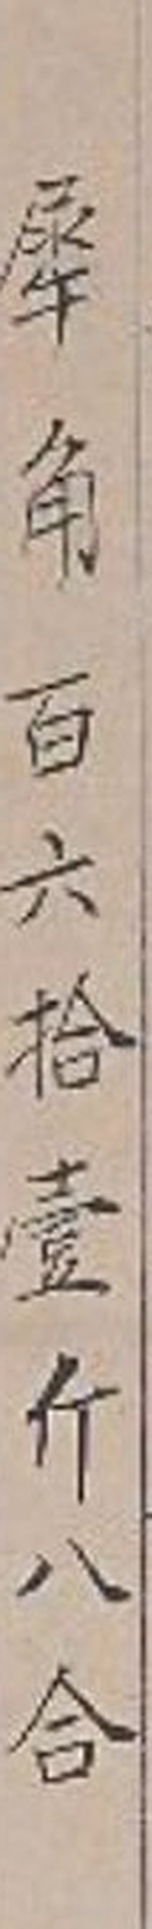犀角百六拾壹斤八合
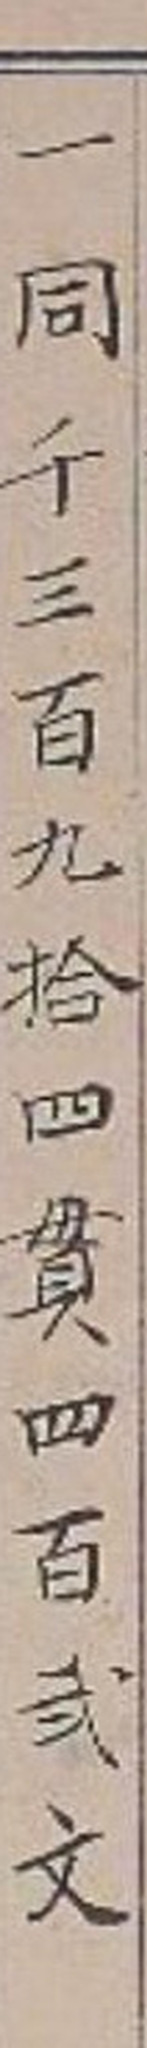一同千三百九拾四貫四百弐文
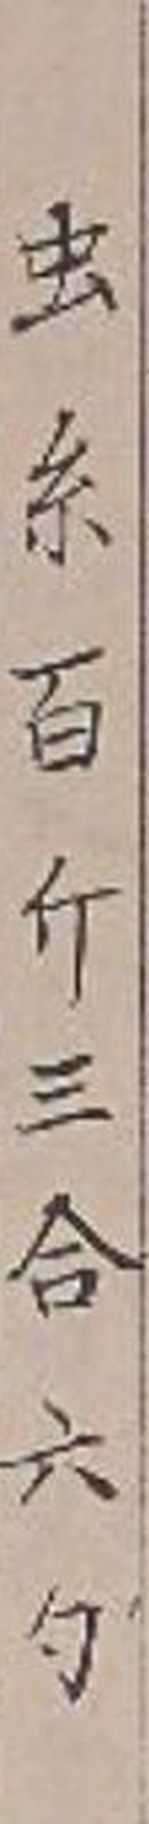虫糸百斤三合六勺
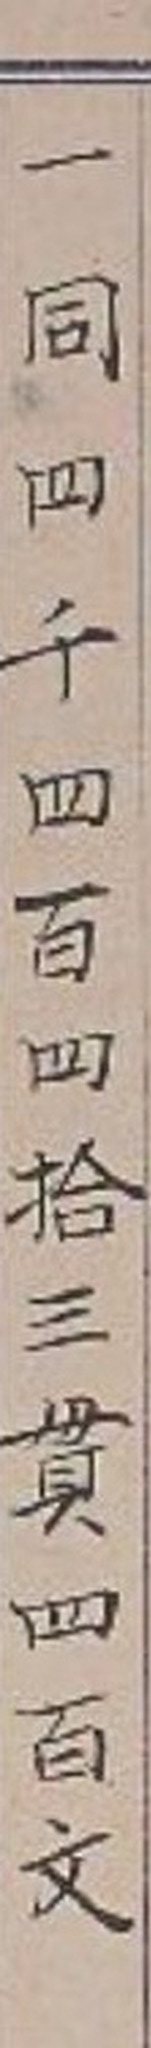一同四千四百四拾三貫四百文
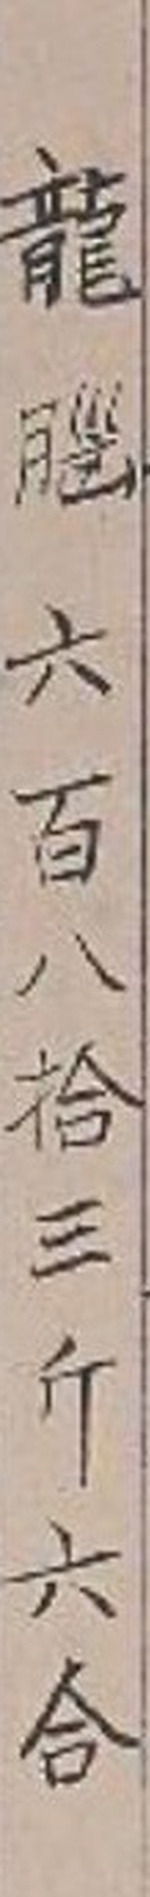龍腦六百八拾三斤六合
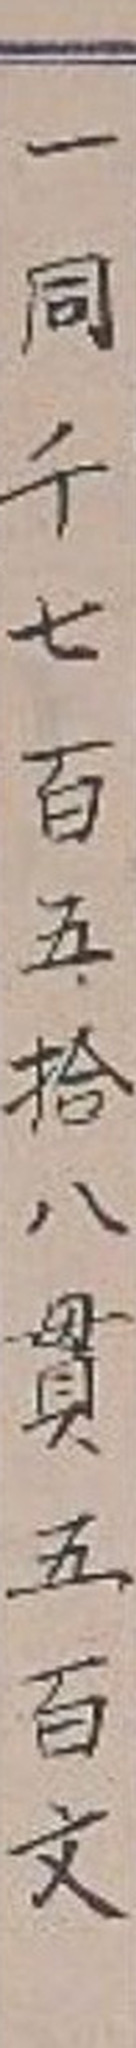一同千七百五拾八貫五百文
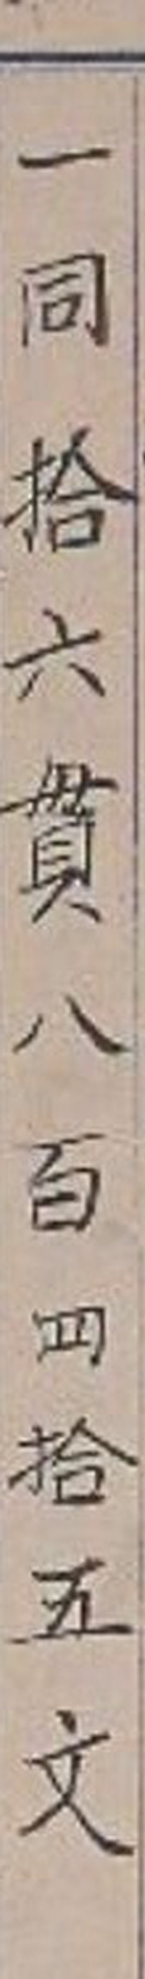一同拾六貫八百四拾五文
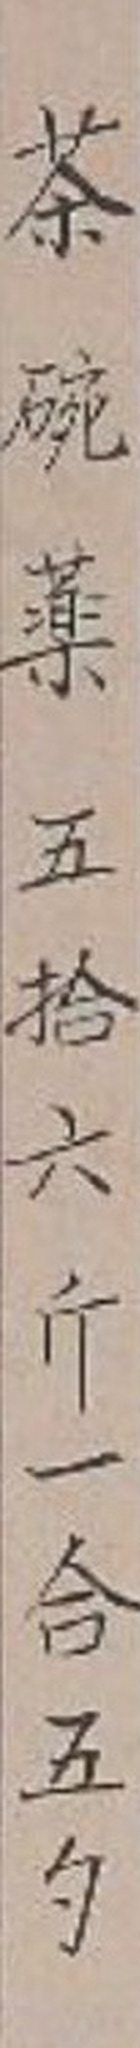茶碗薬五拾六斤一合五勺

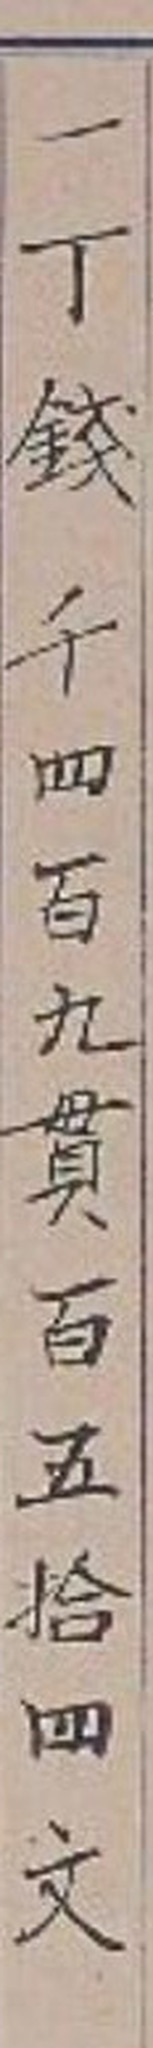一丁錢千四百九貫百五拾四文
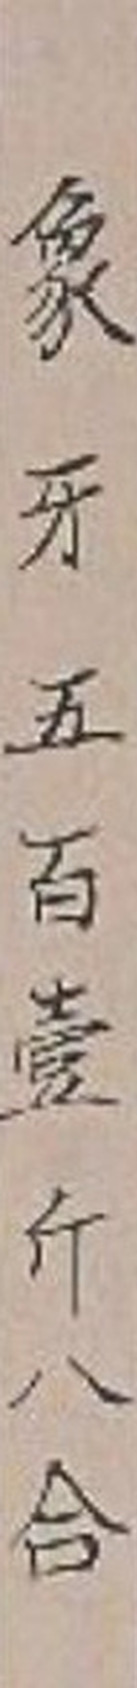象牙五百壹斤八合
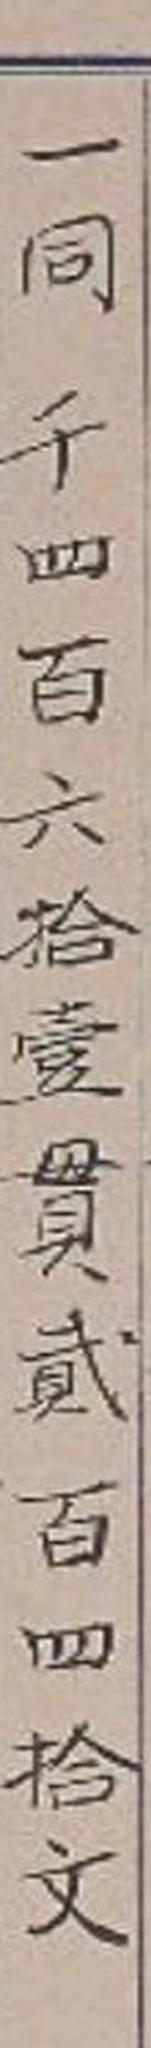一同千四百貫六拾壹貫貳百四拾文
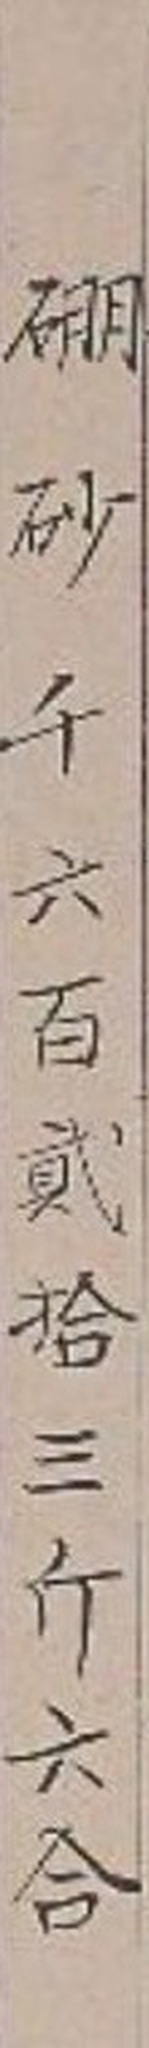硼砂千六百貳拾三斤六合
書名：琉球産物於長崎拂立並本手品利潤総帖 弘化四年より酉年迄
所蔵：University of the Ryukyus Library
